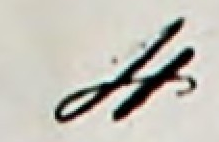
4
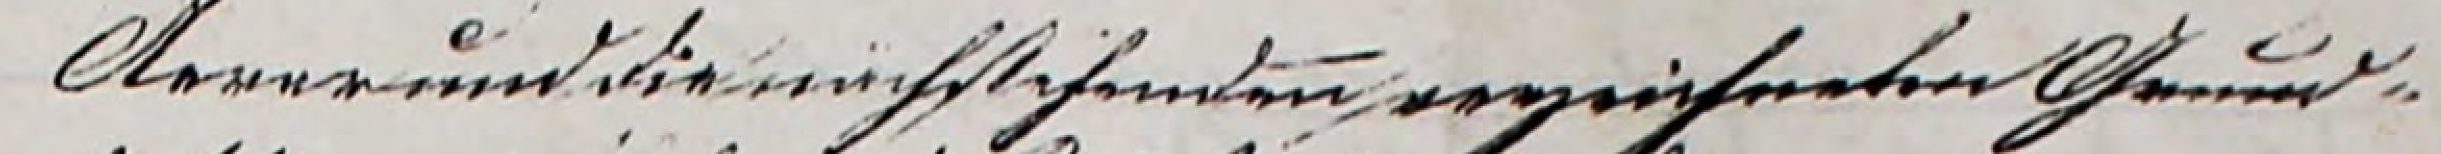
Aerer und die nachstechenden verzeichneten Grund„
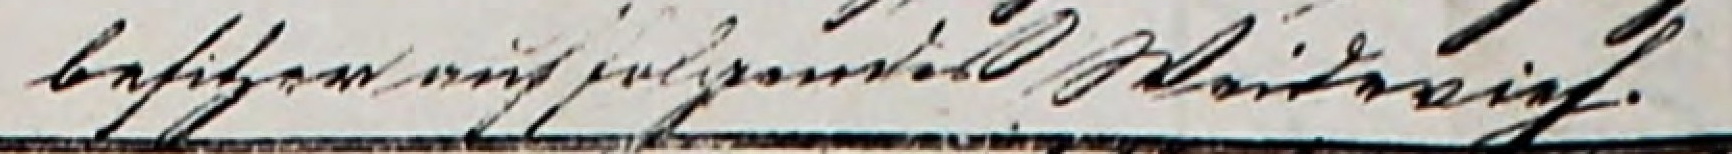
besitzer auf folgendes Weiderieh.
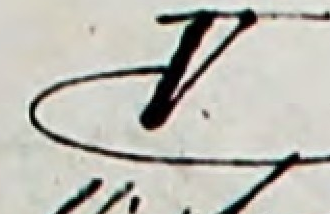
V.
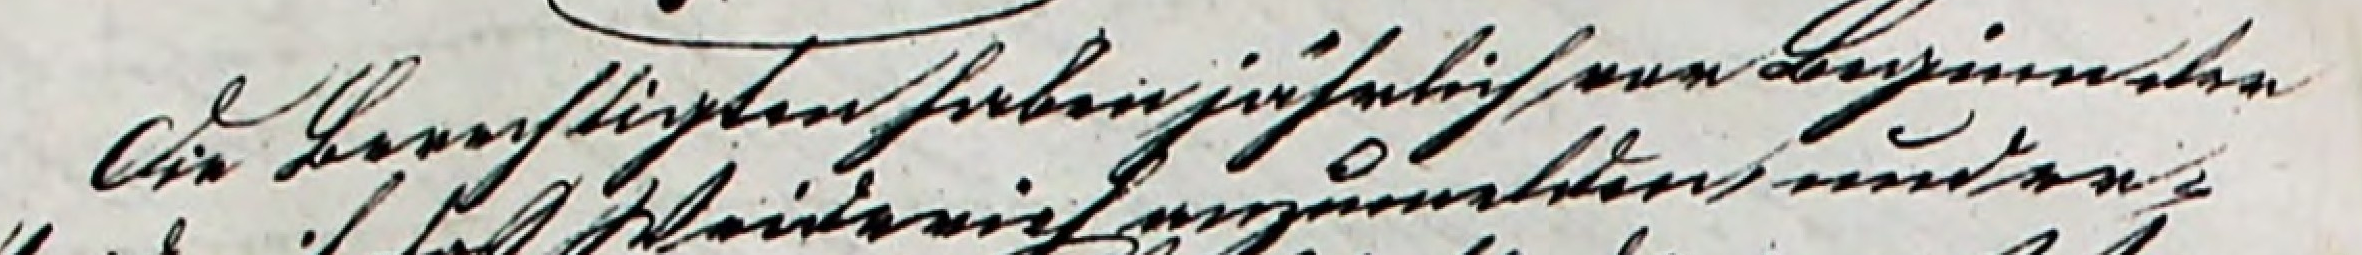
Die Berechtigten haben jährlich vor Beginn der
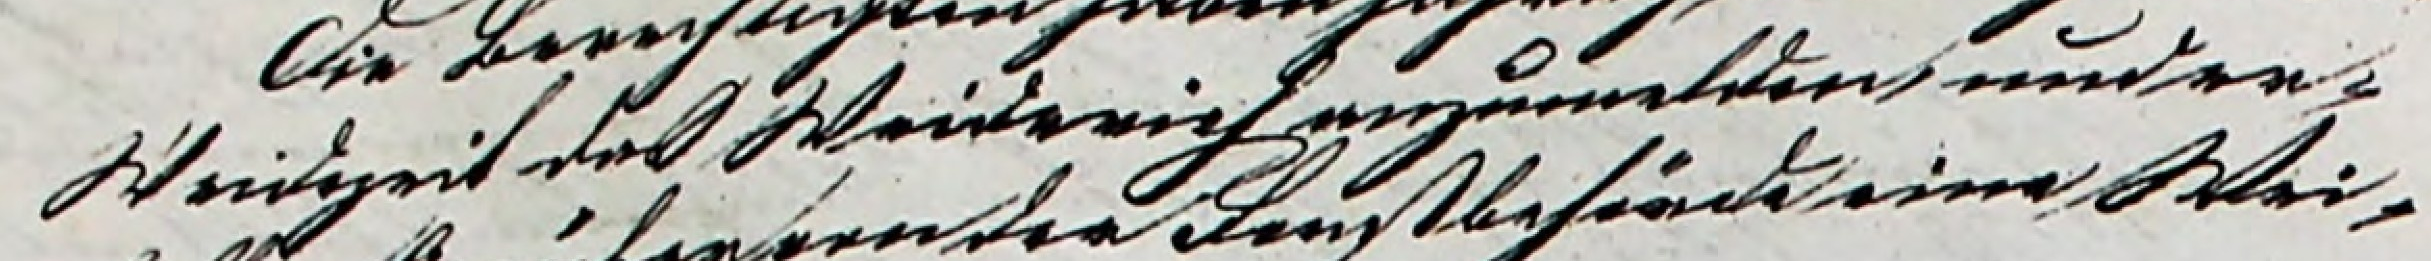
Weidezeit das Weiderich anzumelden, und er„
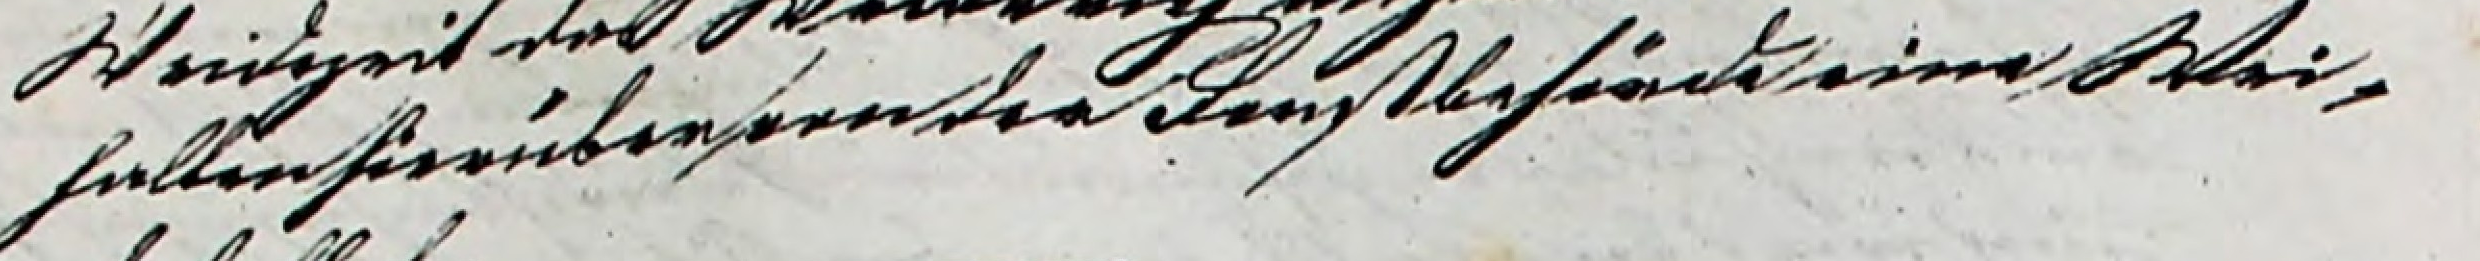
halten hierüber von der Forstbehörde eine Wei„
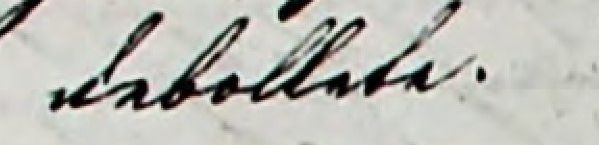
debollete.
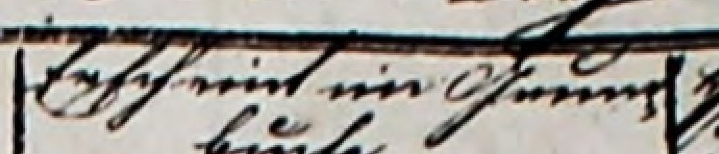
Erscheint im Grund„
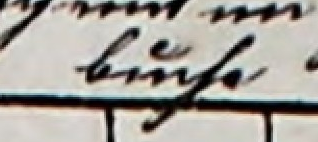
buche
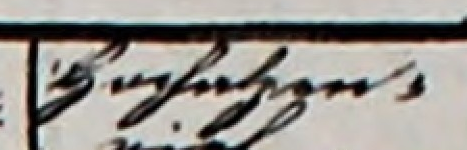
Hochatzen„
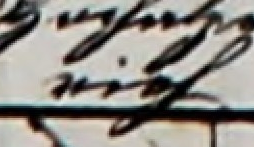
vieh
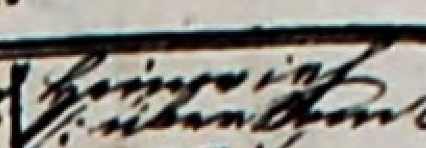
Heimvieh
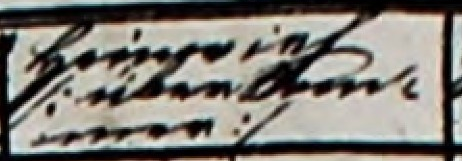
/: über Sum„
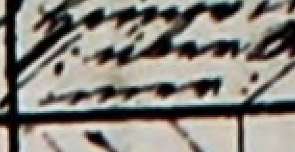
mer :/
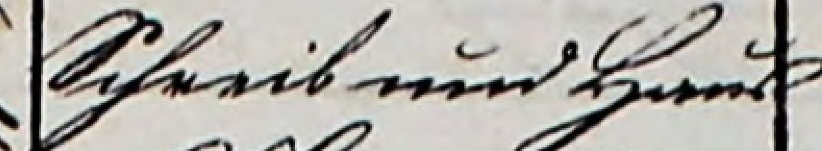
Schreib und Haus
